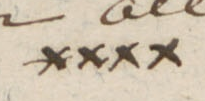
enorm war. %
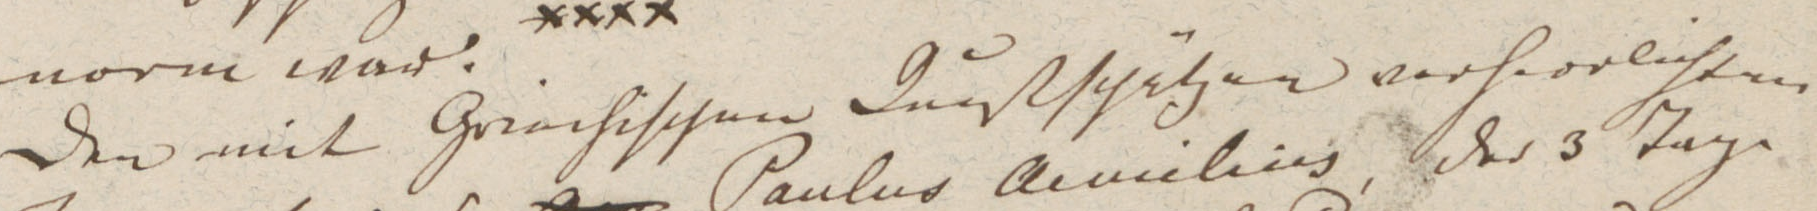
Den mit Griechischen Kunstschätzen verherrlichten
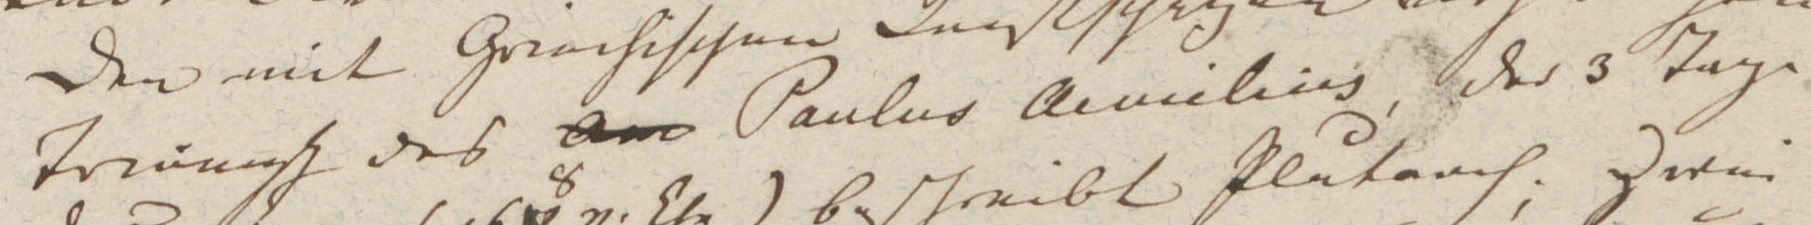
Triumph des Am Paulus Aemilius, der 3 Tage
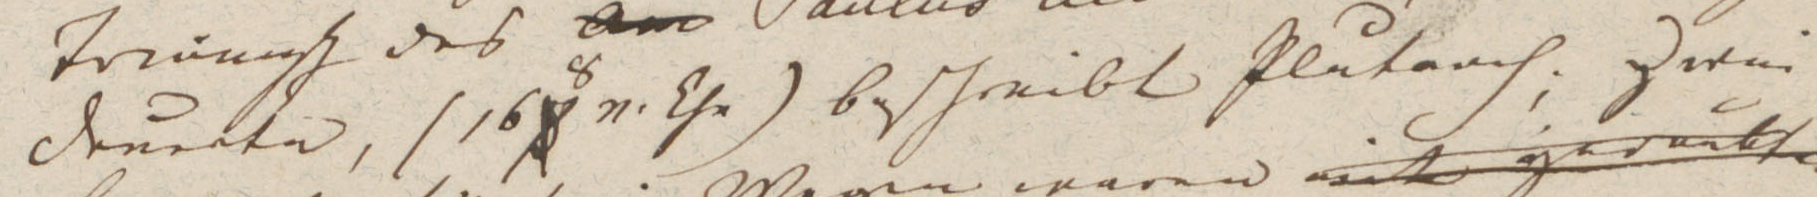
dauerte, (1688 v. Chr) beschreibt Plutarch; Zwei
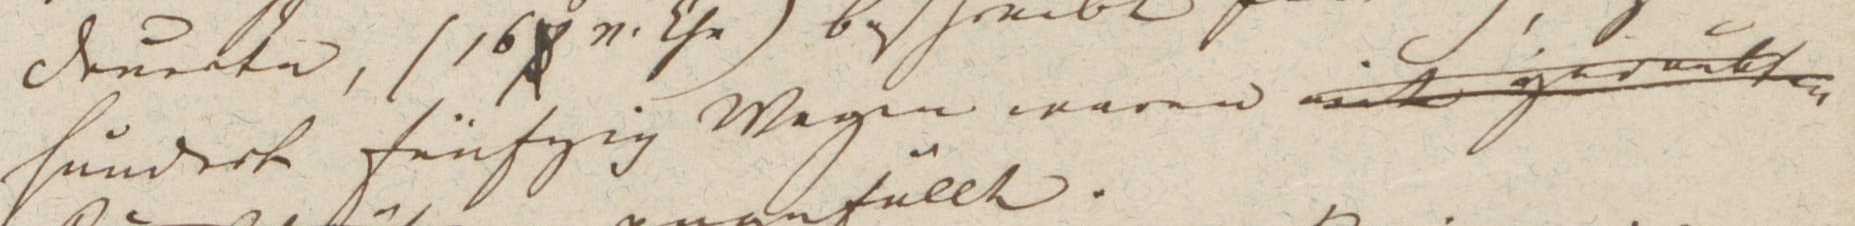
hundert fünfzig Wagen waren mit geraubten
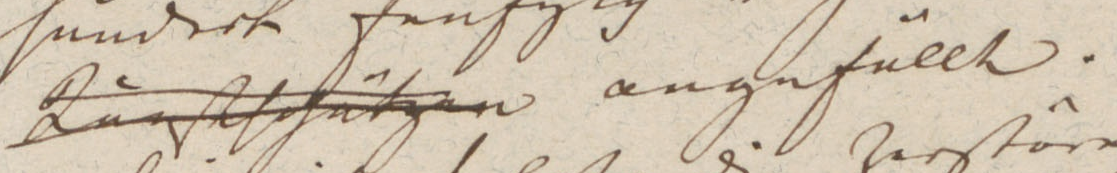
Kunstschätzen angefüllt.
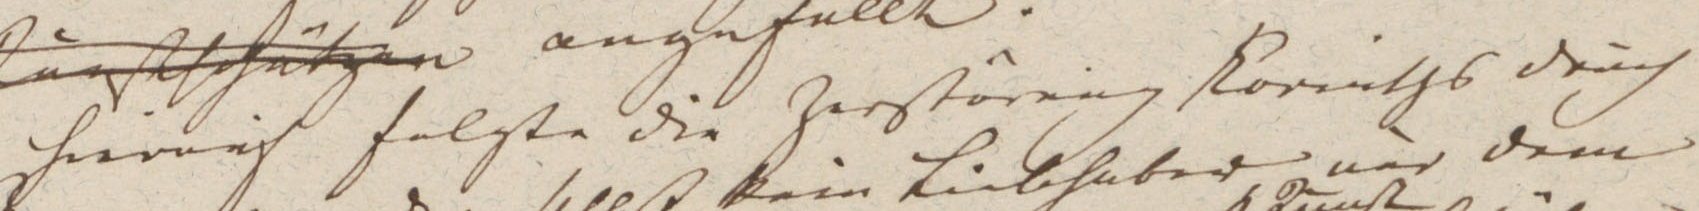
Hierauf folgte die Zerstörung Korinths durch
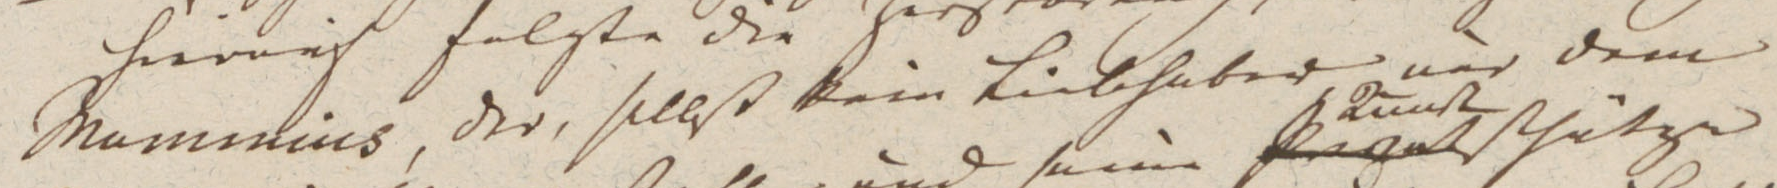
Mummius, der, selbst kein Liebhaber nur dem
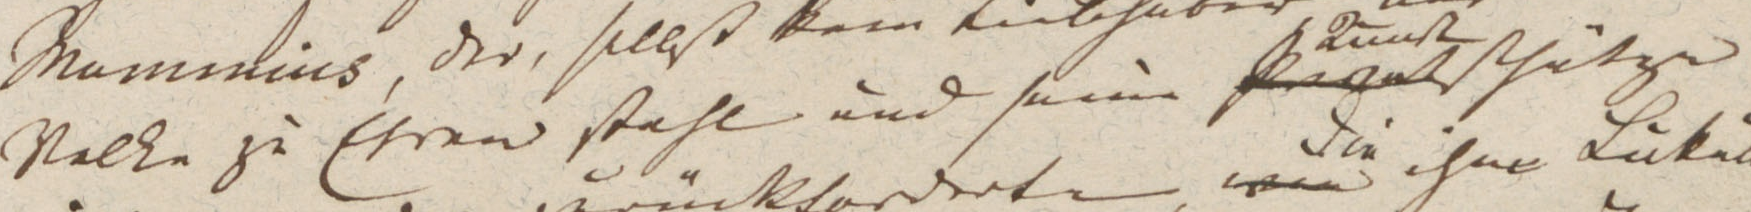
Volke zu Ehren stahl und seine Kunstschätze
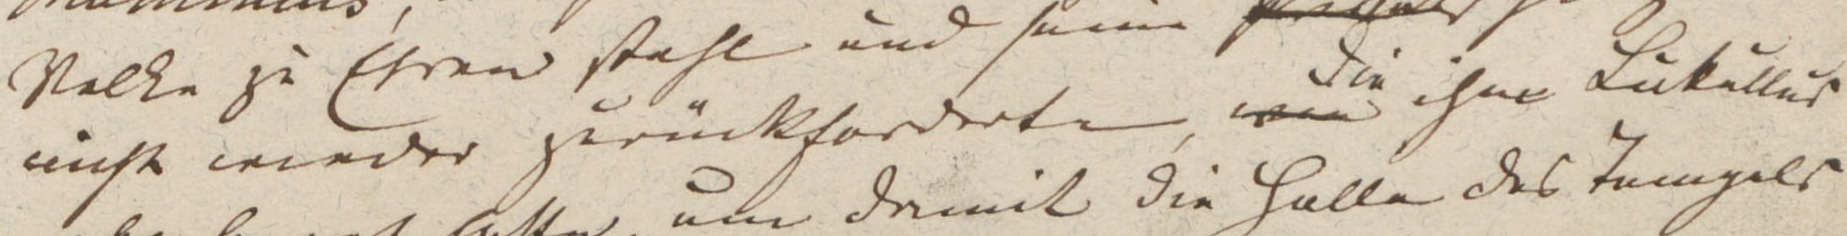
nicht wieder zurückforderte, wie die ihnm Lukullus
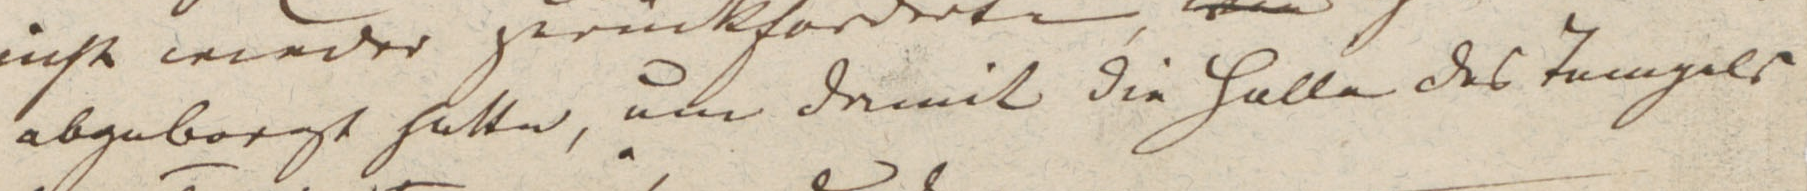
abgeborgt hatte, um damit die Halle des Tempels
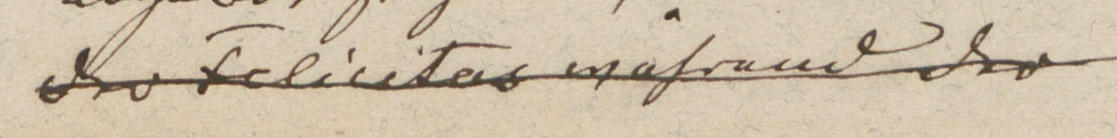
der Felicitas während der
